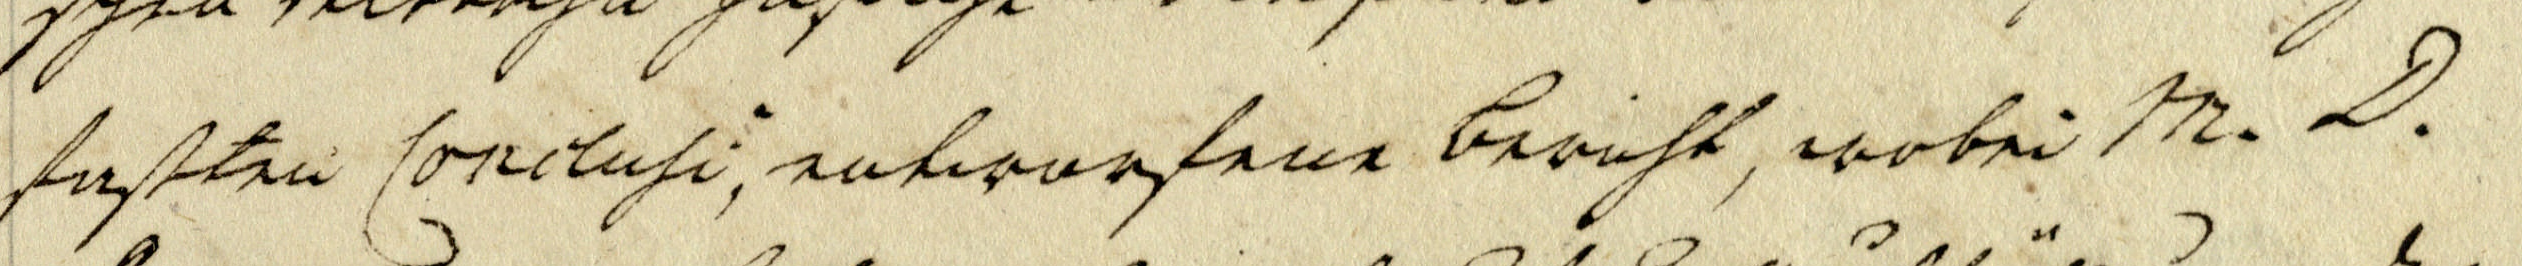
fasten Conclusi entworfene Bericht, wobei M. D.
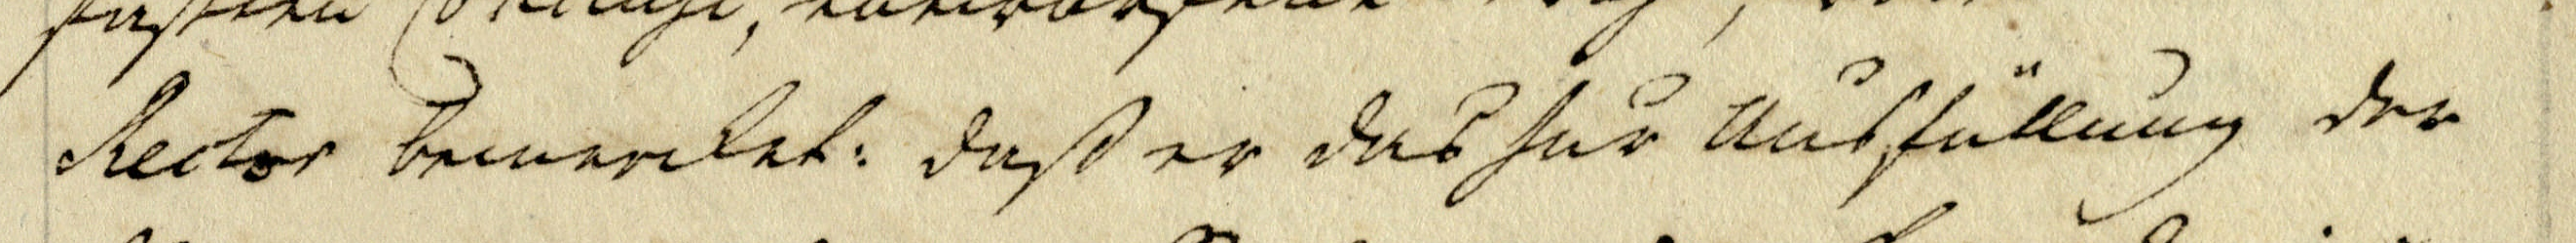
Rector bemercket: daß er das zur Ausfüllung der
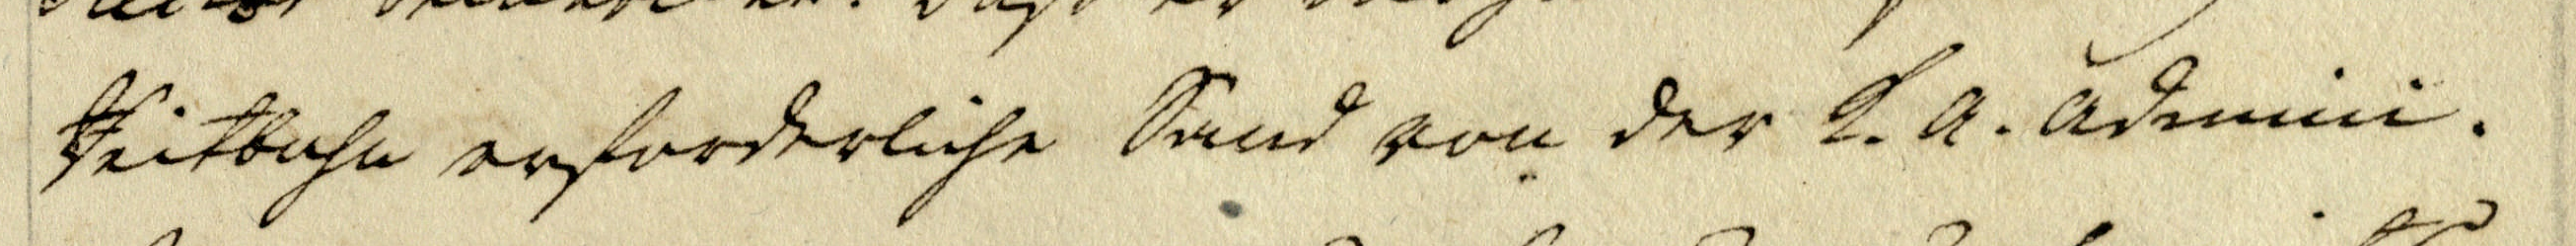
Reitbahn erforderliche Sand von der K. A. Admini¬
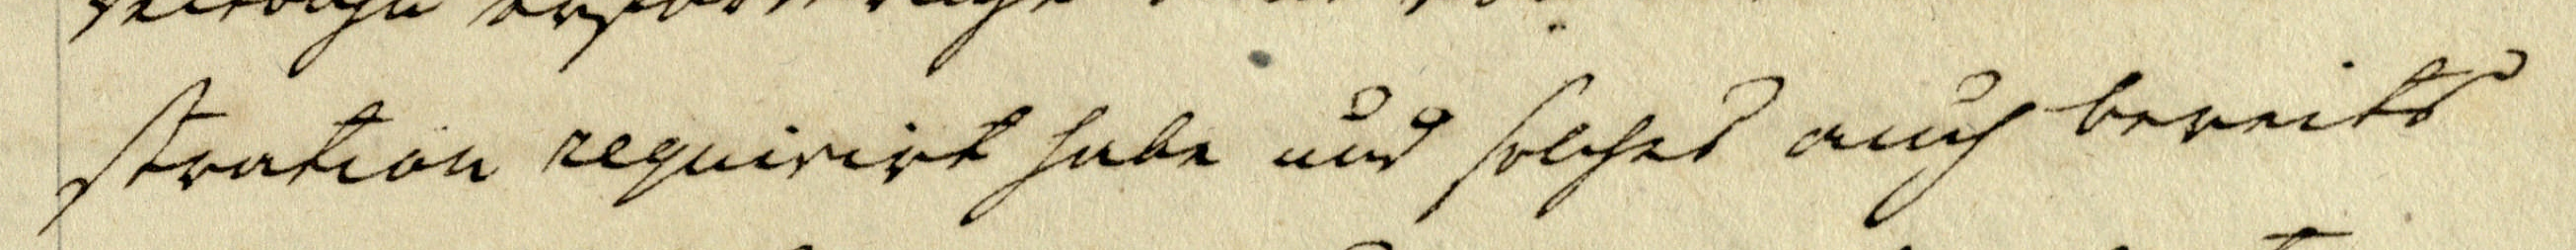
stration requirirt habe und solches auch bereits
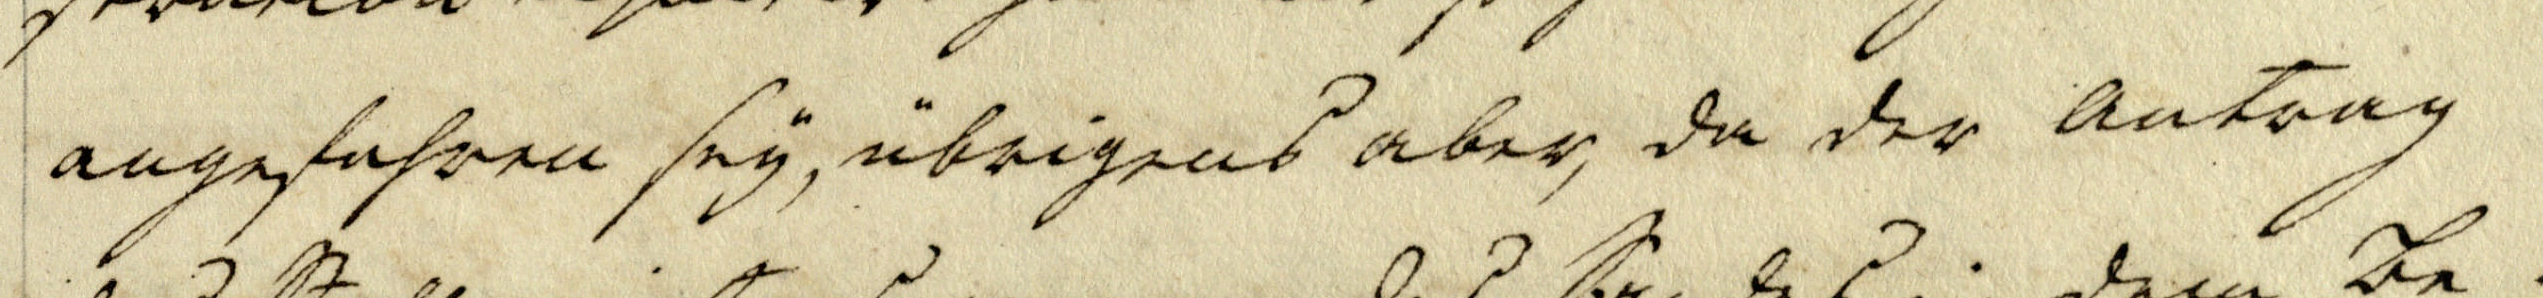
angefahren seÿ, übrigens aber, da der Antrag
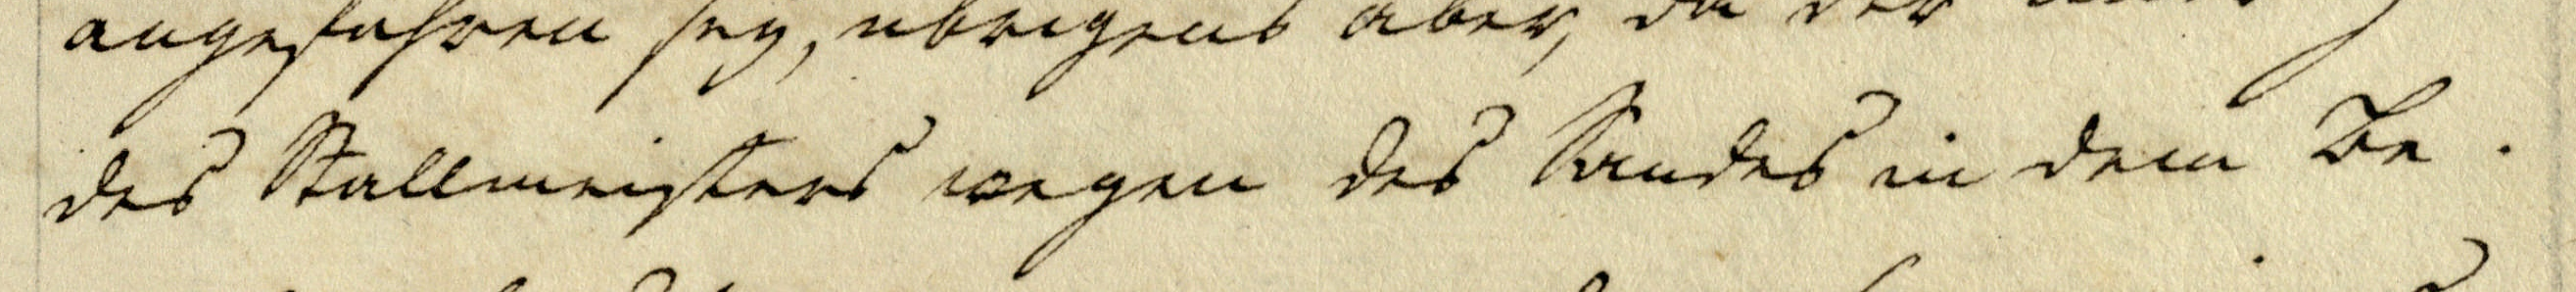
des Stallmeisters wegen des Sandes in dem Be¬
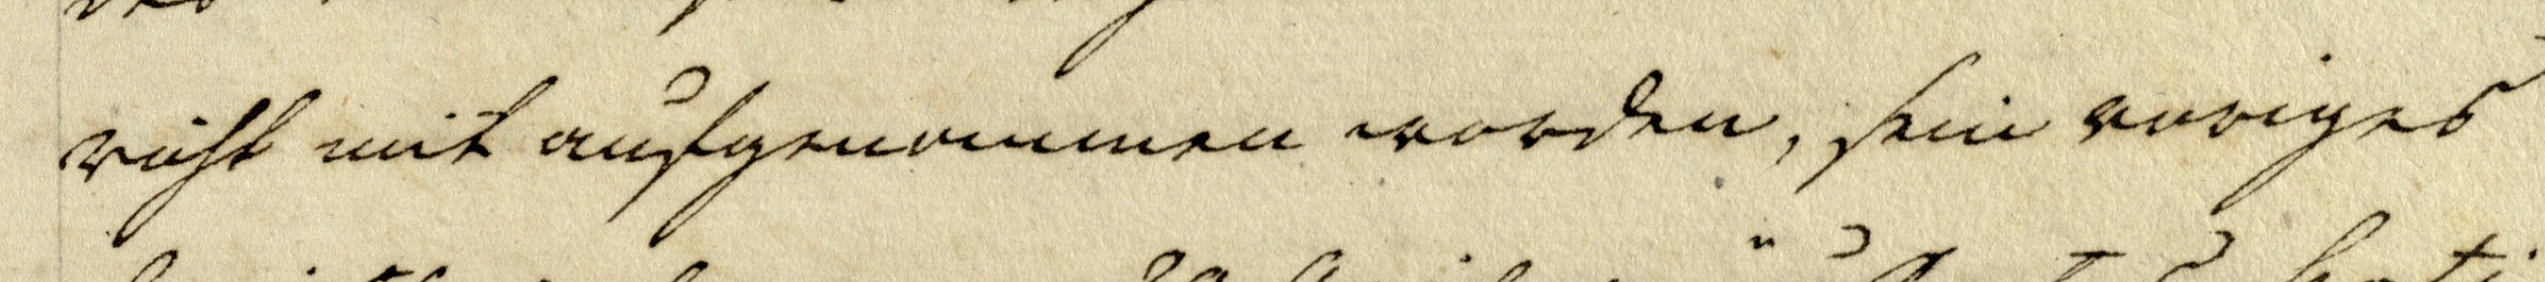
richt mit aufgenommen worden, sein voriges
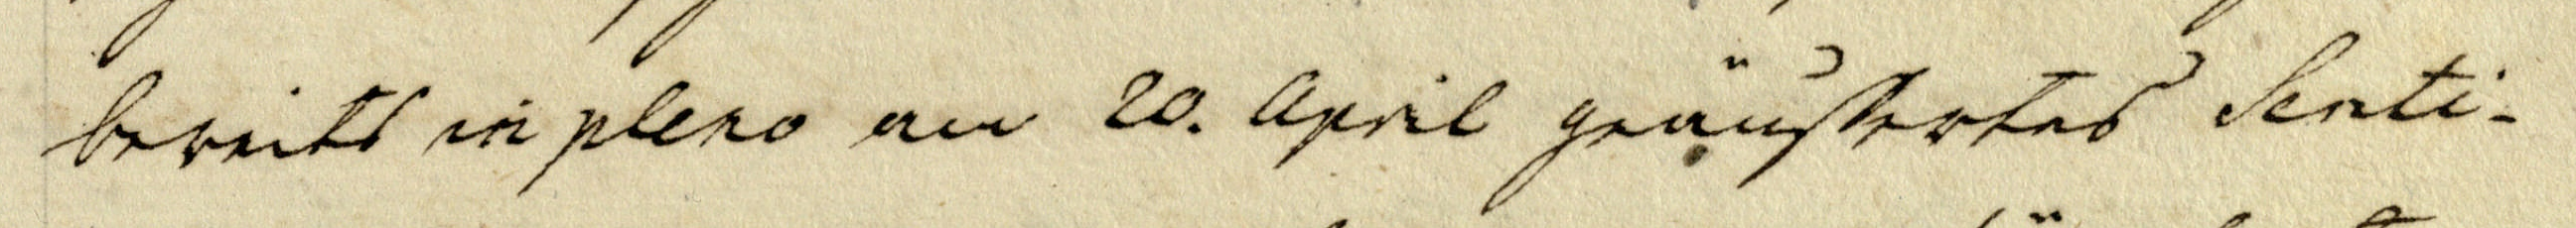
bereits in pleno an 20. April geäussertes Senti¬
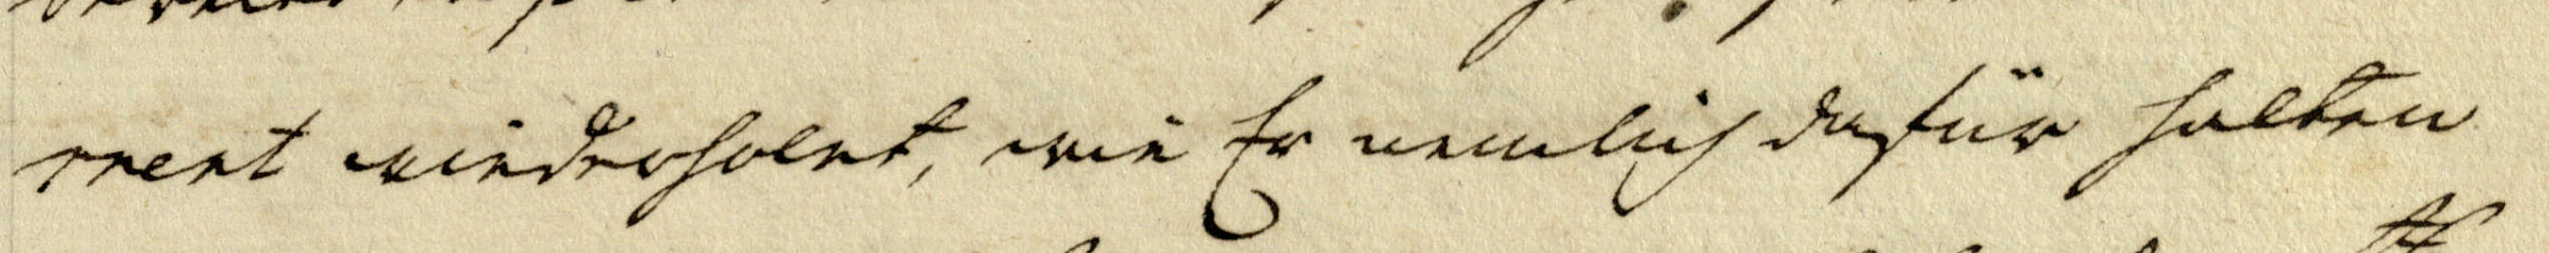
ment wiederholet, wie Er nemlich dafür halten
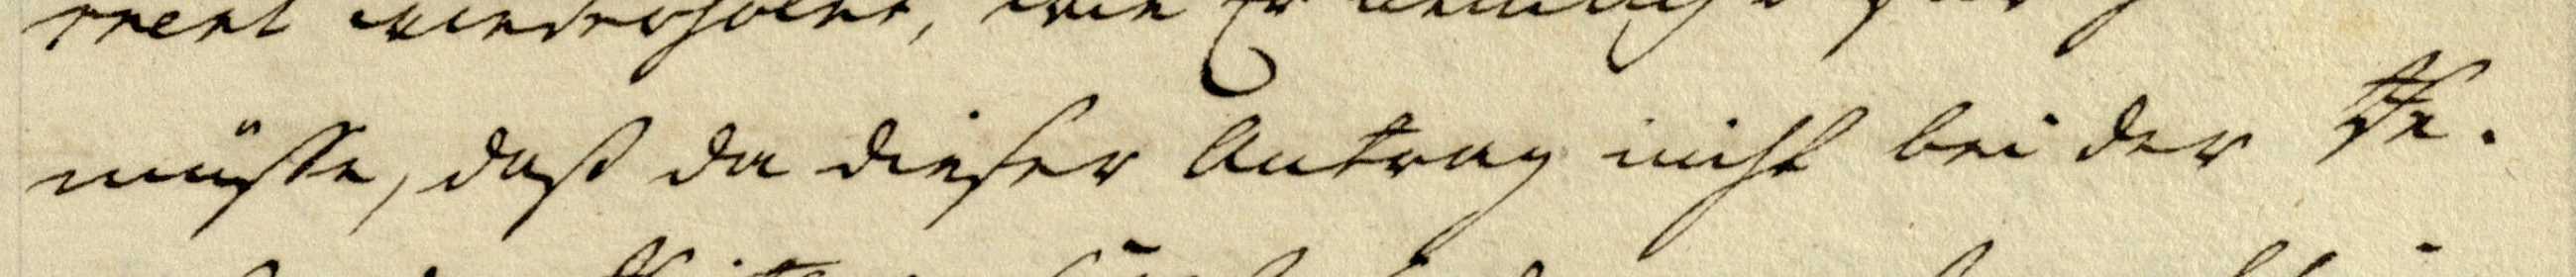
müsse, daß da dieser Antrag nicht bei der Re¬
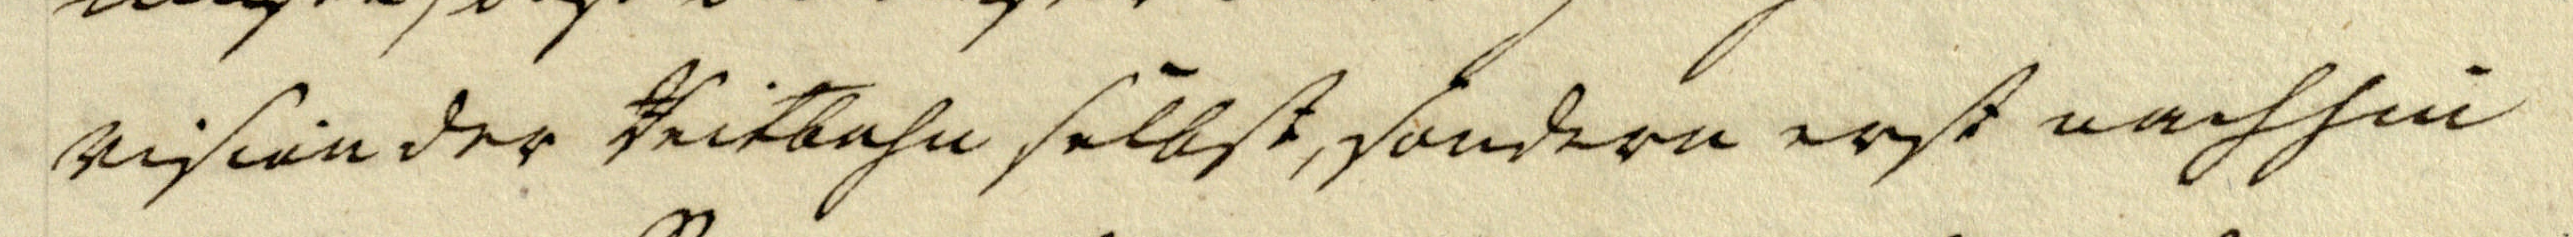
vision der Reitbahn selbst, sondern erst nachhin
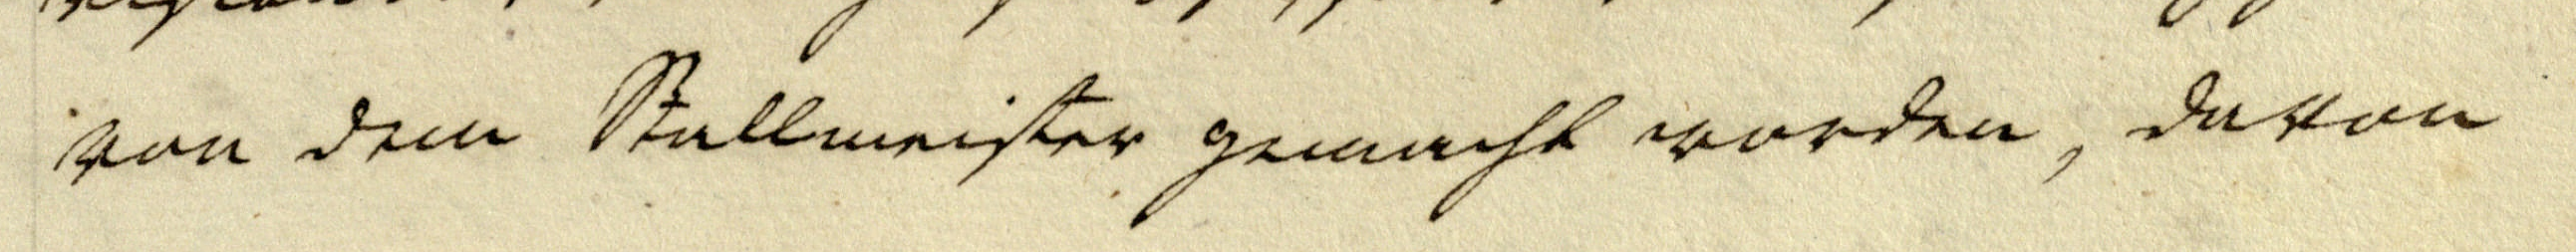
von dem Stallmeister gemacht worden, davon
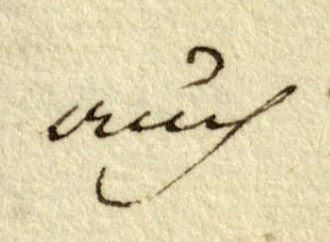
auch
